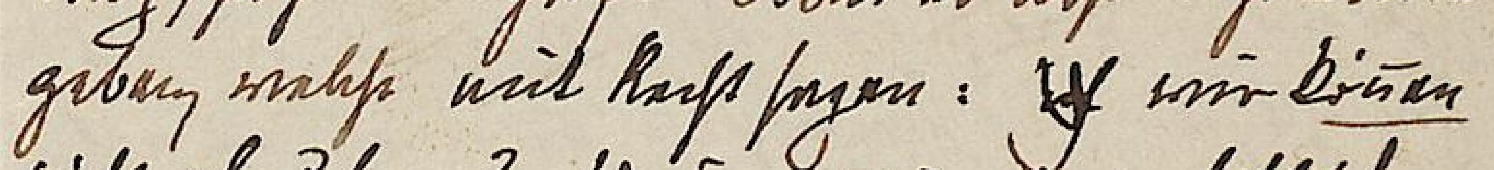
geben, welche mit Recht sagen: ich wir könen
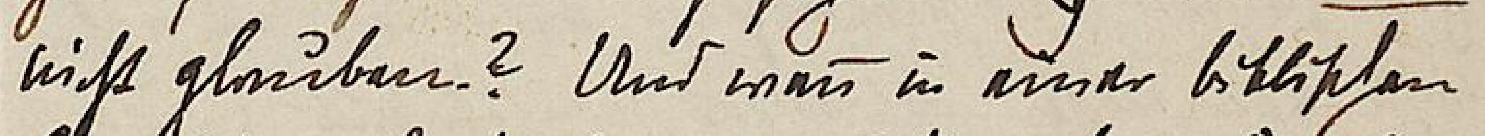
nicht glauben? Und wen in einer biblischen
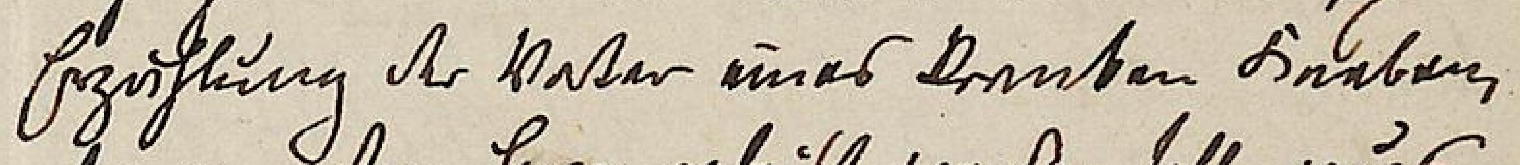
Erzählung der Vater eines kranken Knaben,
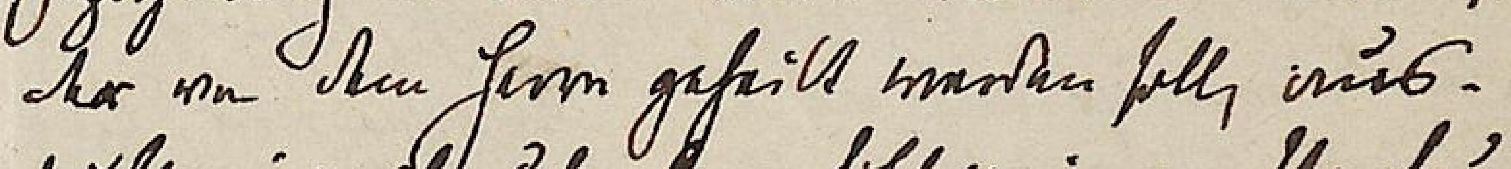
der von dem Herren geheilt werden soll, aus¬
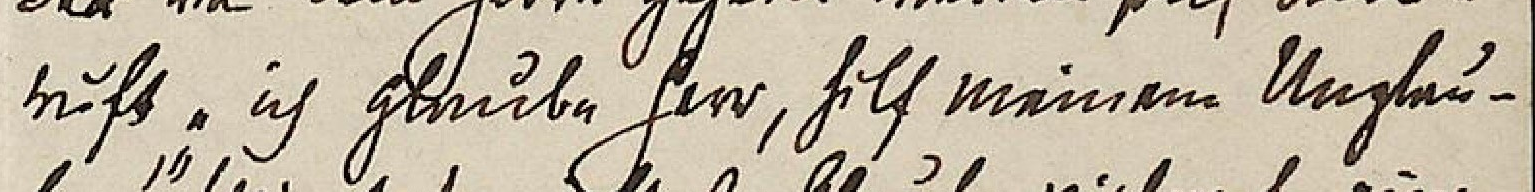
ruft "ich glaube Herr, hilf meinem Unglau¬
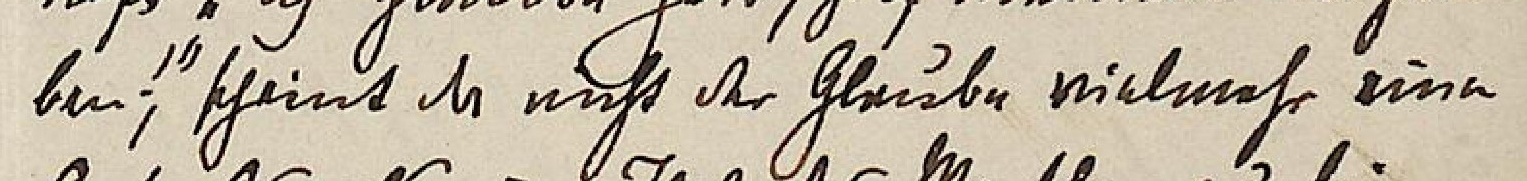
ben!," scheint da nicht der Glaube vielmehr eine
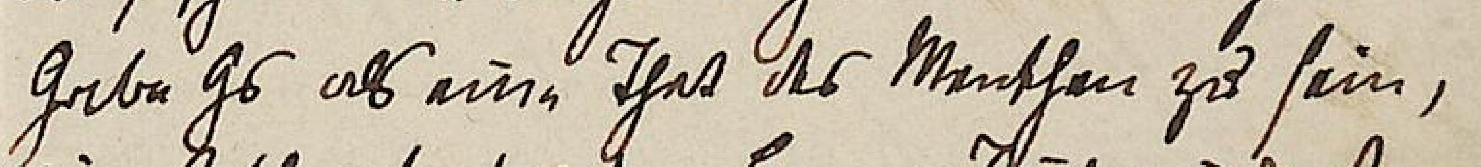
Gabe Gs als eine That des Menschen zu sein,
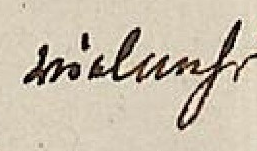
vielmehr
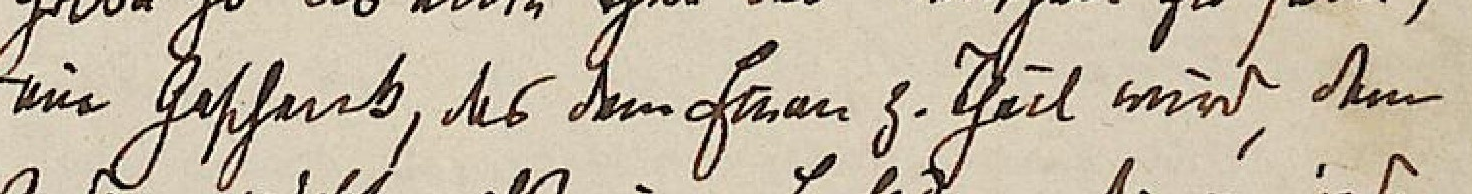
ein Geschenk, das dem Einen z. Theil wird, dem
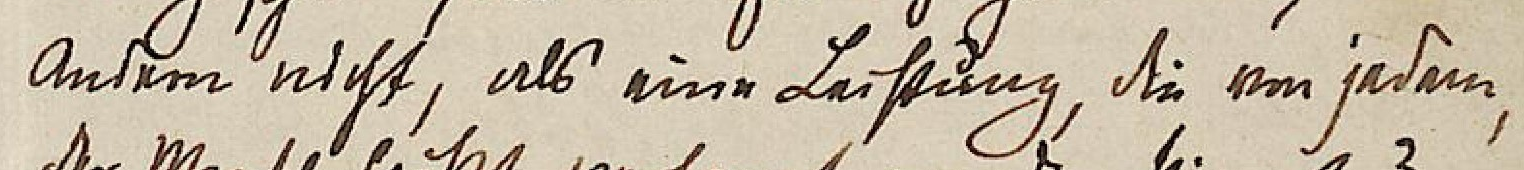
Anderen nicht, als eine Leistung, die von jedem,
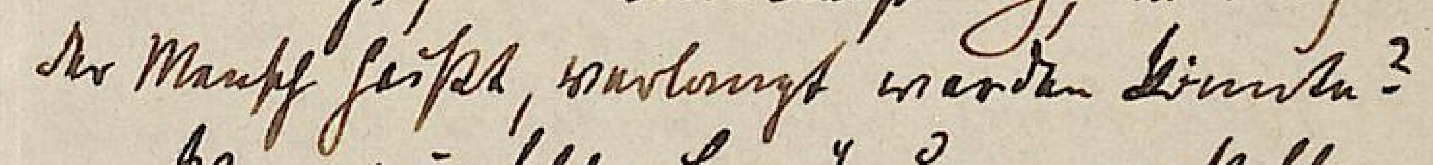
der Mensch helißt, verlangt werden könnte?
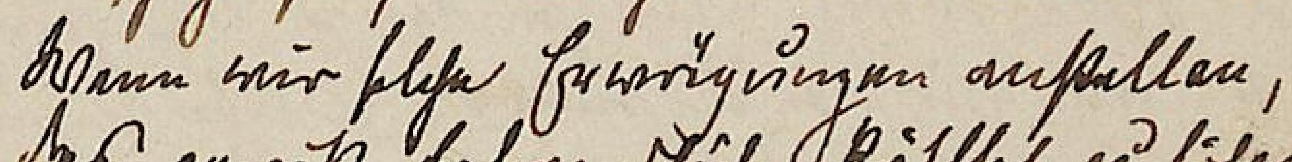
Wenn wir solche Erwägungen anstellen,
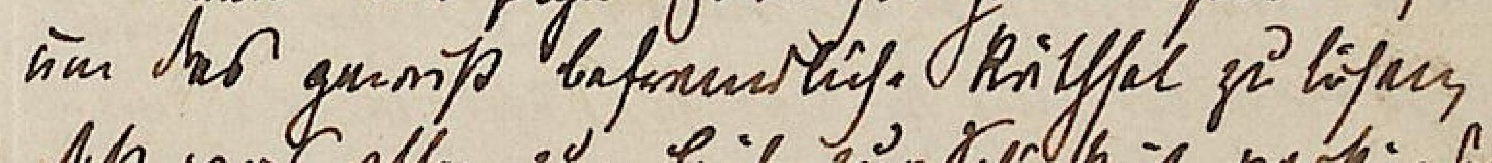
um das gewiß befremdliche Räthsel zu lösen,
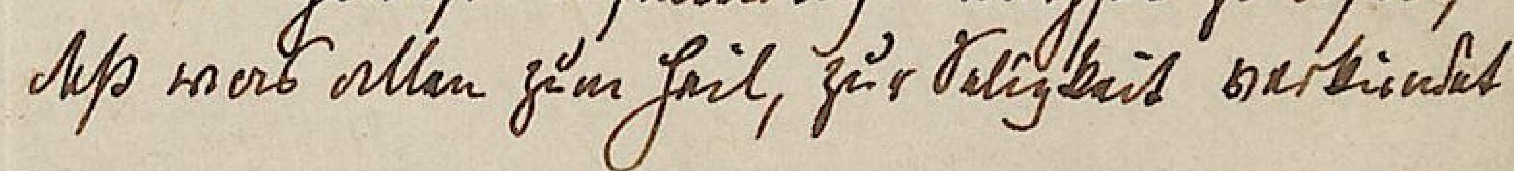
daß was allen zum Heil, zur Seligkeit verkündet
